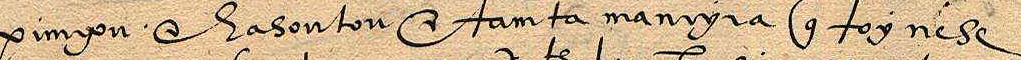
pimgou. e hasoutou ē tamta maneyra q̄ foy nese
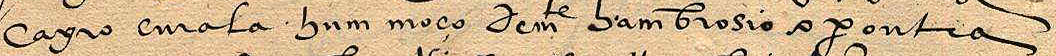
cayro curala. hum moço de mte hambrosio e ꝑ outra
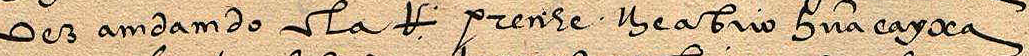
vez amdamdo ela R prenhe lhe abrio hūa cayxa
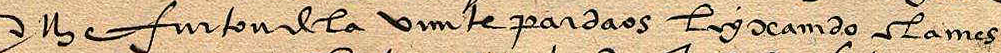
e lhe furtou dela vimte pardaos leyxamdo ela mes
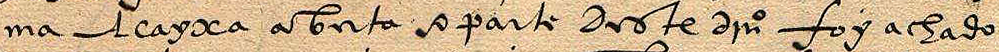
ma A cayxa aberta e parte deste drro foy achado
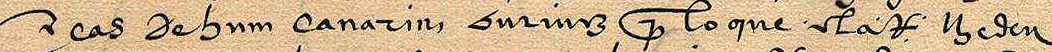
ē cas de hum canarim ouriuez p̄lo que ela R lhe deu
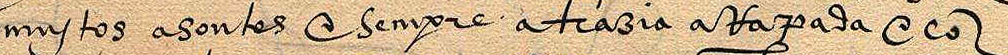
mujtos asoutes e sempre a trazia aRapada e cō
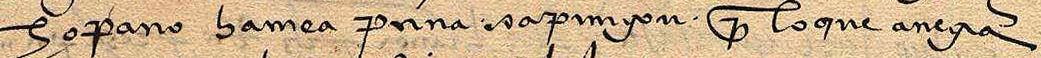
ho pano ha mea perna e a pimgou. p̄lo que a negra
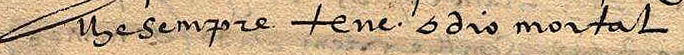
lhe sempre teue odio mortaL /
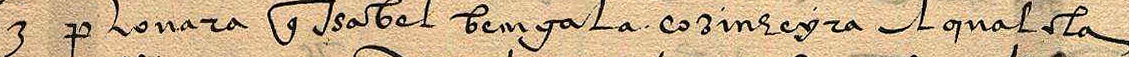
prouara q̄ Jsabel bemgaLa cozinheyra A qual ela
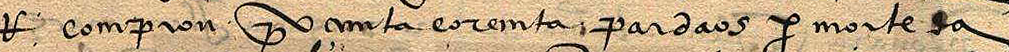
R comprou p̄o çemta coremta pardaos ꝑ morte da
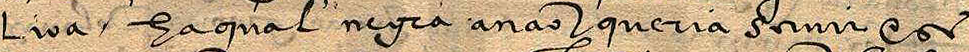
Lioa / ha qual negra a naō queria seruir e sē
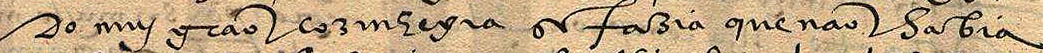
do muj graõ cozinheyra se fazia que naõ Sabia
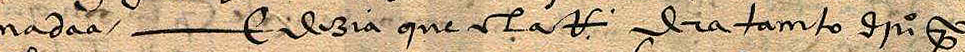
nadaa / E dezia que ela R dera tamto drro p̄o
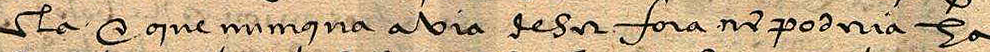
ela e que numqua avia de ser fora nē poderia ha
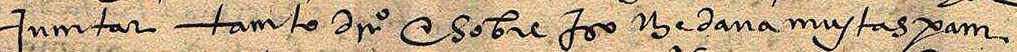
Jumtar tamto drro e sobre Jso lhe daua mujtas pam
